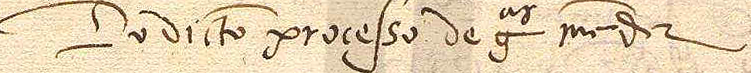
Do dict̄o processo de gar mēdez
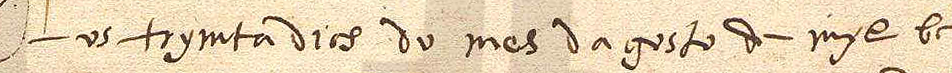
Aos trymta dias do mes dagosto de myl bc
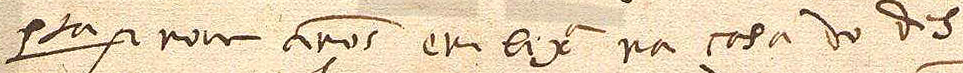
Lta e noue an̄os em lixa na casa do des
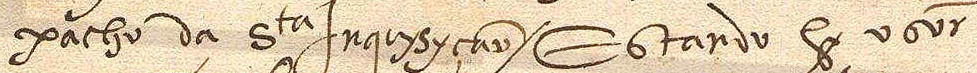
pacho da Sta Jnquysyção / Estando hy o sōr
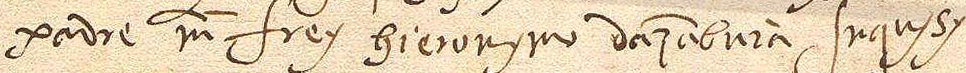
padre mte frey hieronymo daz̄abuia Jnquysy
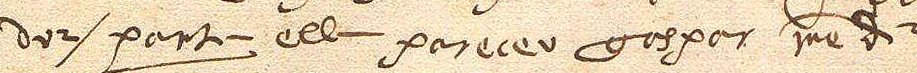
dor / ꝑante elle pareceo gaspar m̄edez
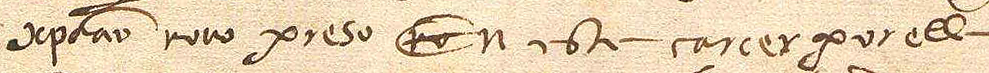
xpaão nouo preso En este carcer por elle
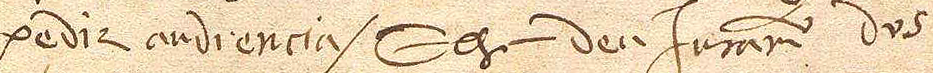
pedir audiencia / E lhe deu Juramto dos
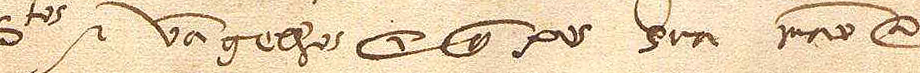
Stos evāgelhos ē q̄ pos sua mão e
